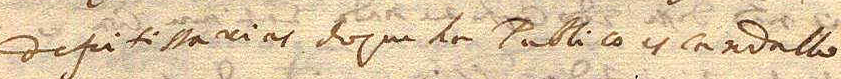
de feitissarias do que he Publico escandallo
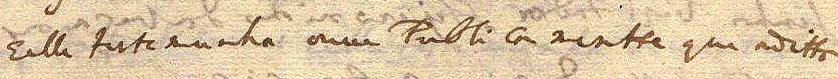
E elle testemunha ouue Publicamentte que a ditta
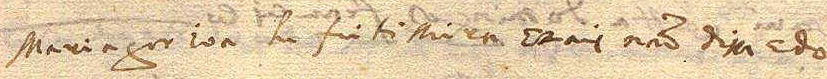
Maria gorioa he feitisseira E mais não disse E do
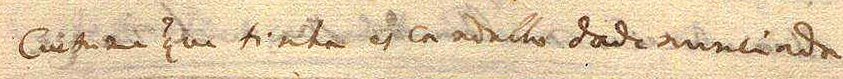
Custume que tinha escandallo da denunciada
